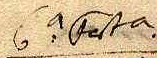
6.a Testa.
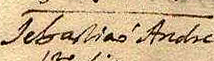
Sebastiaõ Andre.
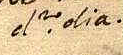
dt.o dia.
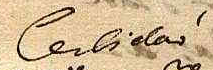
Certidaõ
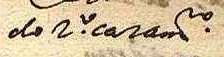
do 2.o cazamto.
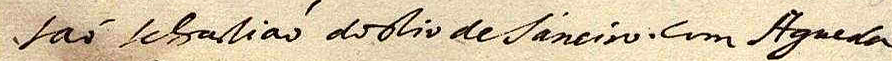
saõ sebastiaõ do Rio de Ianeiro, com Agueda
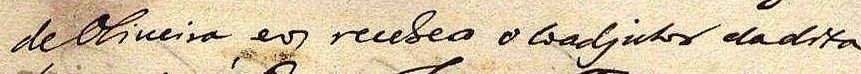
de Oliueira, e os recebeo o coadjutor da dita
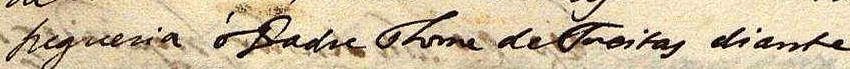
freguezia o Padre Thome de Freitas diante
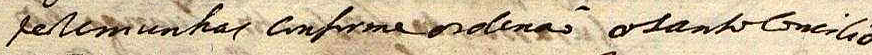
testemunhas conforme ordenaõ o santo concilio
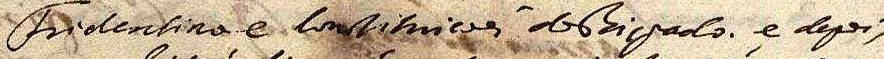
Tridentino, e constituiçoes do Bispado., e depois
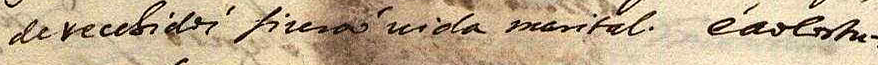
de recebidos fizeraõ vida marital. e ao costu
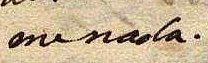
me nada.
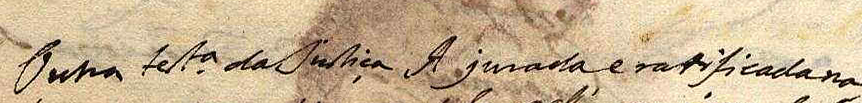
Outra test.a da Iustiça A jurada e ratificada na
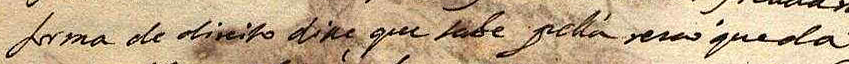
forma de direito disse, que sabe pella rezaõ que dá
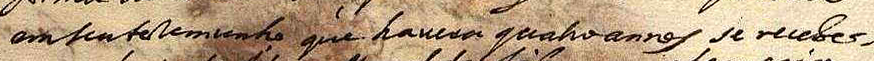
em seu testemunho, que hauera quatro annos, se receber
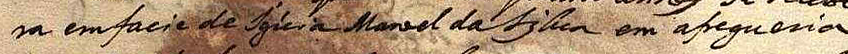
ra em facie de Igreia Manoel da Sjlua em a freguezia
